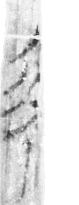○（夕）
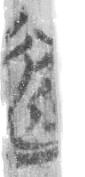遠
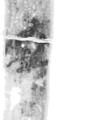○（夕）
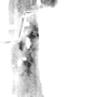不
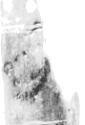可
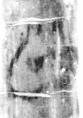㠯（以）
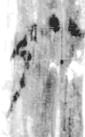北
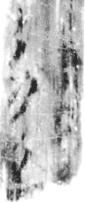○（徙）
